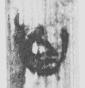自
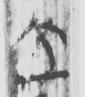立
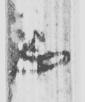㠯（以）
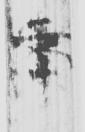不
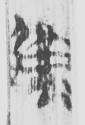備
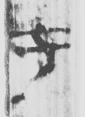于
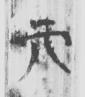亓
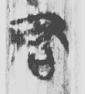君
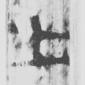上
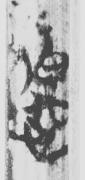{偶心}
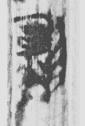則
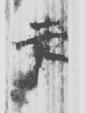下
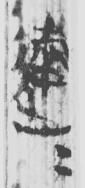{止達}=
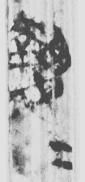執=
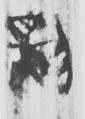則
